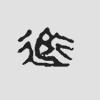{行率}
